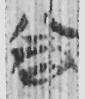尚
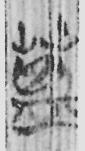藍
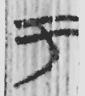于
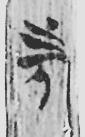先
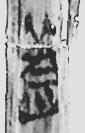舊
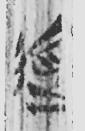道
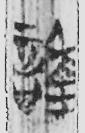{言屮目牛}
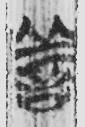善
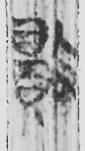{貝貝攴}
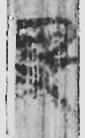卑
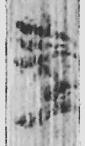{屮王}
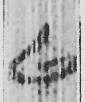㠯（以）
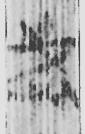戒
